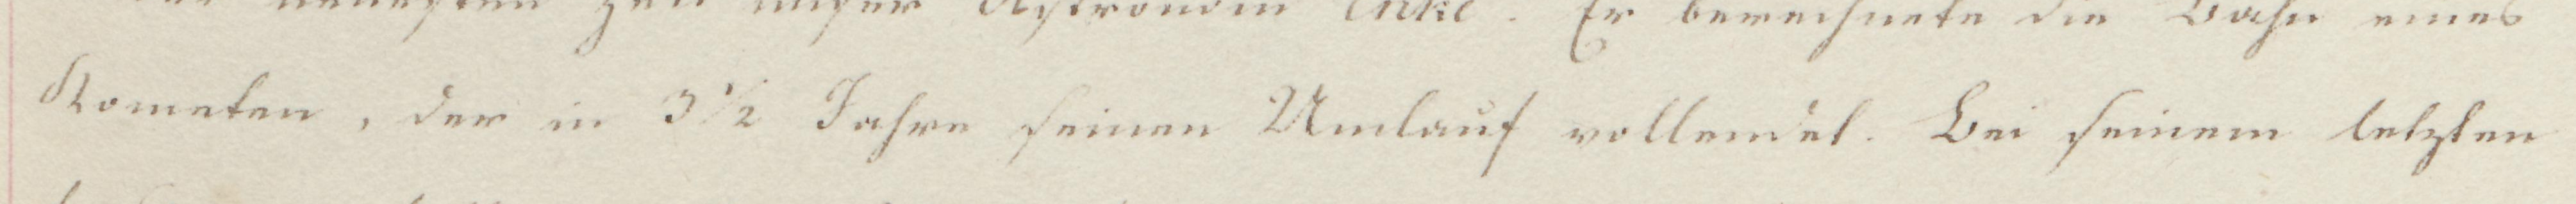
Kometen, der in 3½ Jahre seinen Umlauf vollendet. Bei seinem letzten
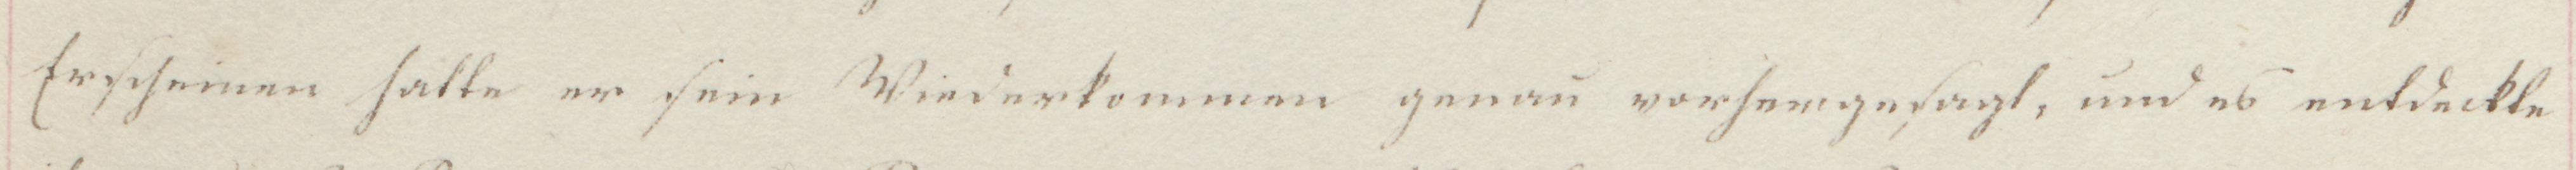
Erscheinen hatte er sein Wiederkommen genau vorhergesagt, und es entdeckte
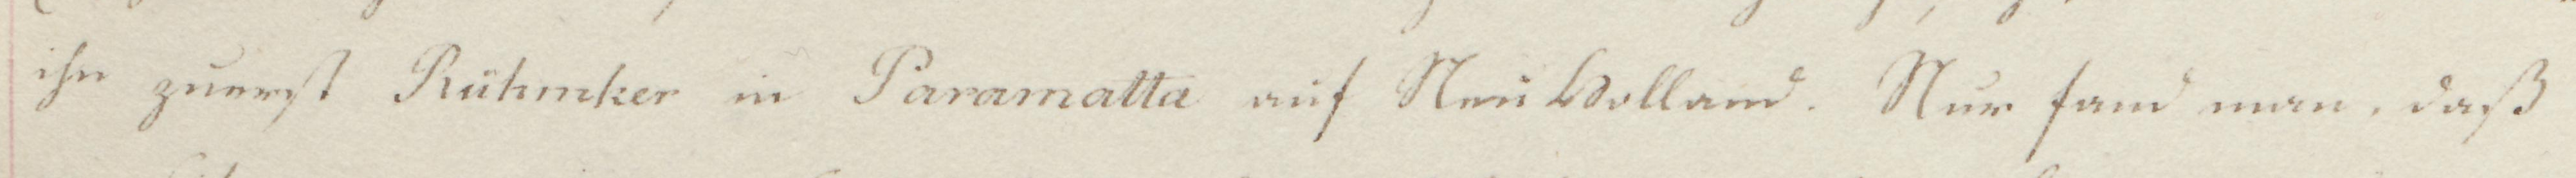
ihn zuerst Rühmker in Paramatta auf Neu Holland. Nur fand man, daß
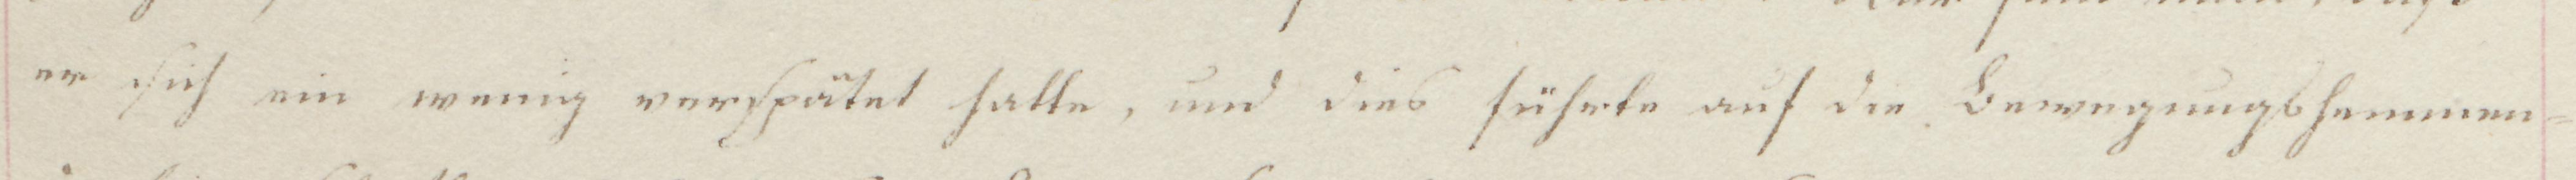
er sich ein wenig verspätet hatte, und dies führte auf die bewegungshemmen-
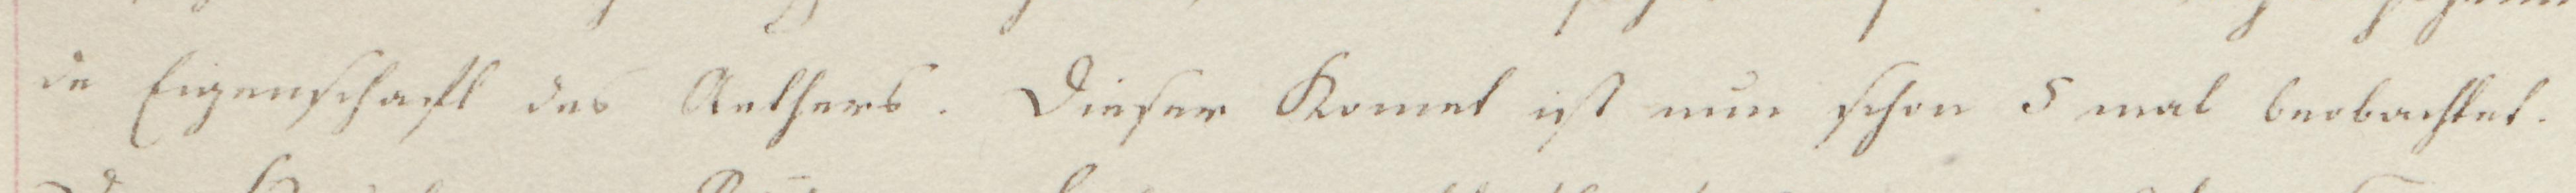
de Eigenschaft des Aethers. Dieser Komet ist nun schon 5 mal beobachtet.
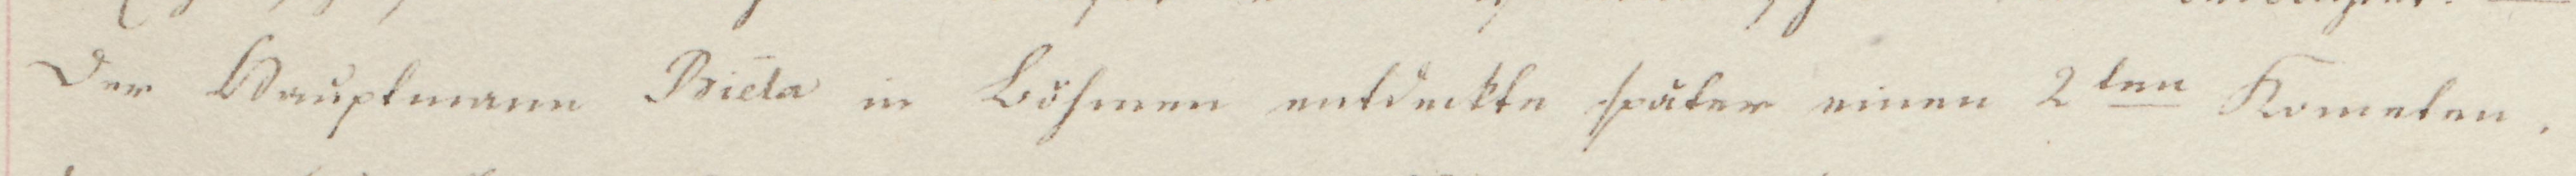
Der Hauptmann Biela in Böhmen entdeckte später einen 2ten Kometen,
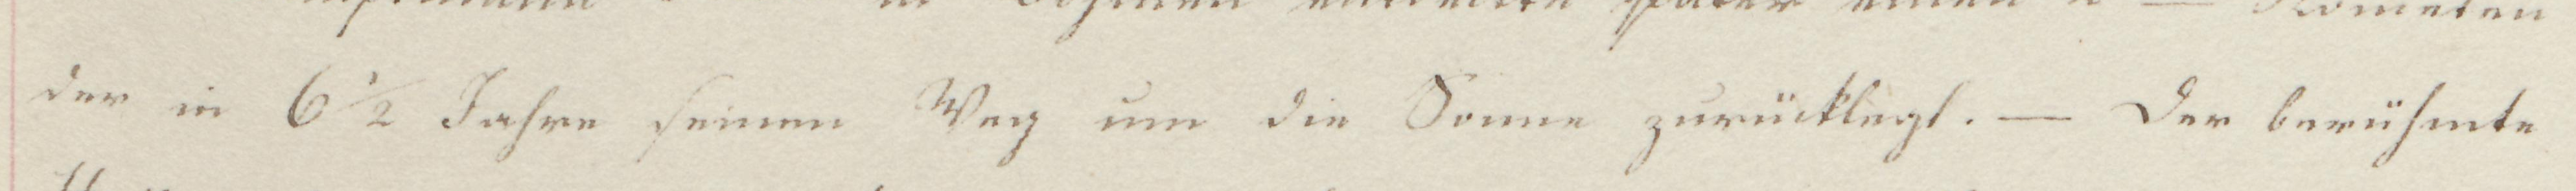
der in 6½ Jahre seinen Weg um die Sonne zurücklegt. – Der berühmte
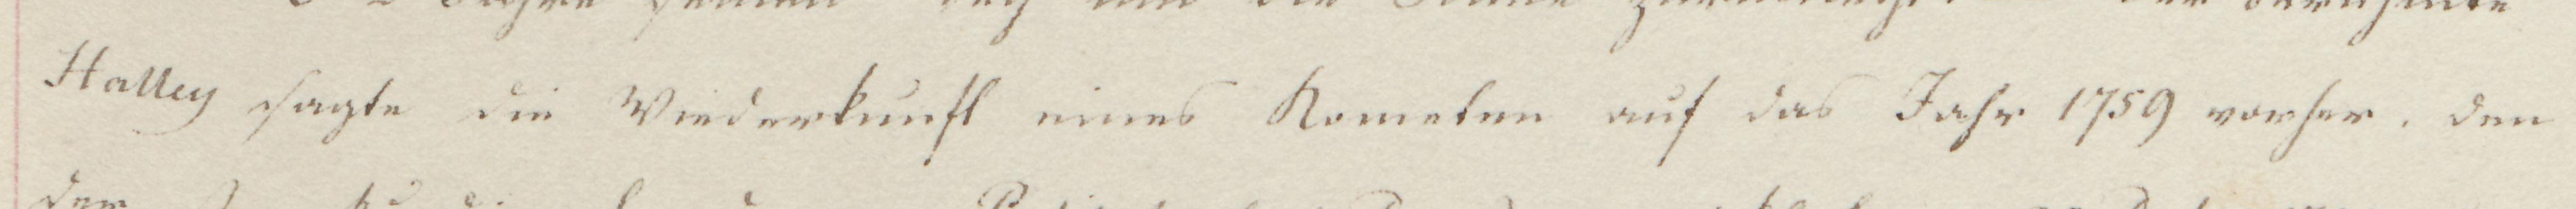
Halley sagte die Wiederkunft eines Kometen auf das Jahr 1759 vorher, den
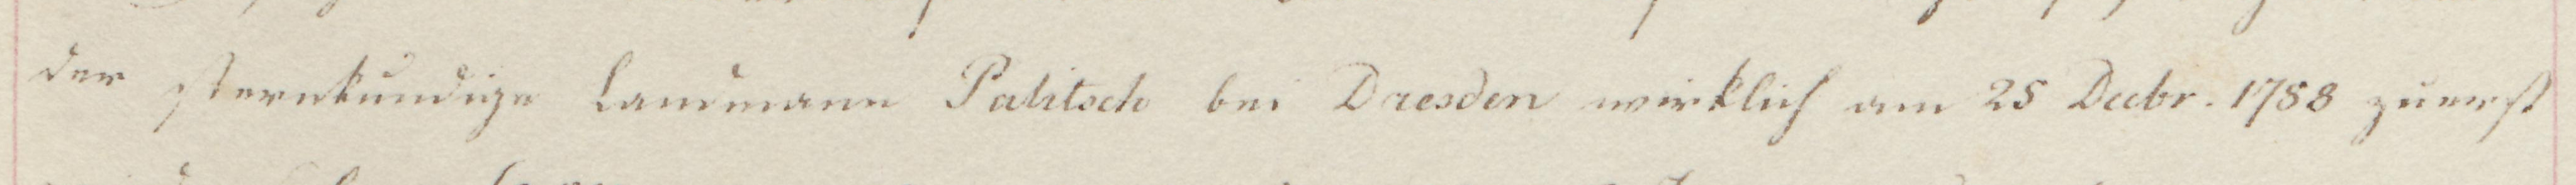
der sternkundige Landmann Palitsch bei Dresden wirklich am 25 Decbr. zuerst
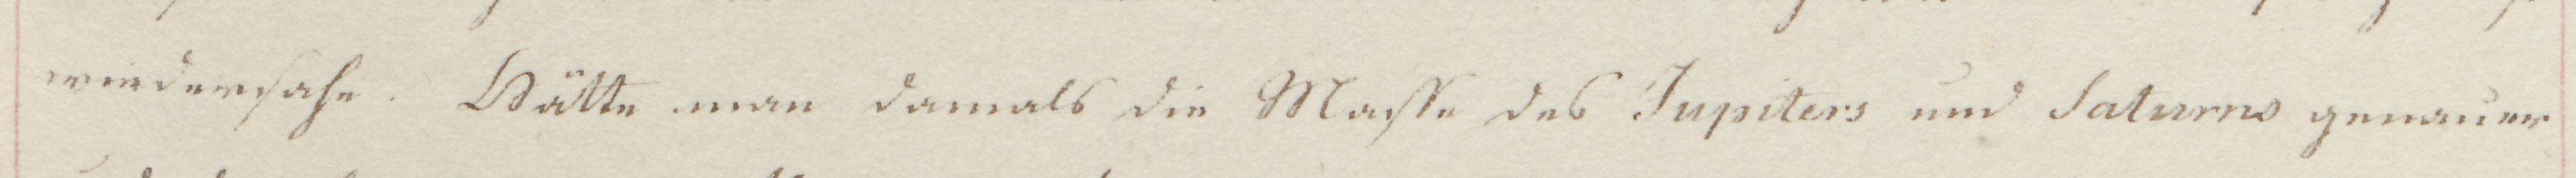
wiedersahe. Hätte man damals die Masse des Jupiters und Saturns genauer
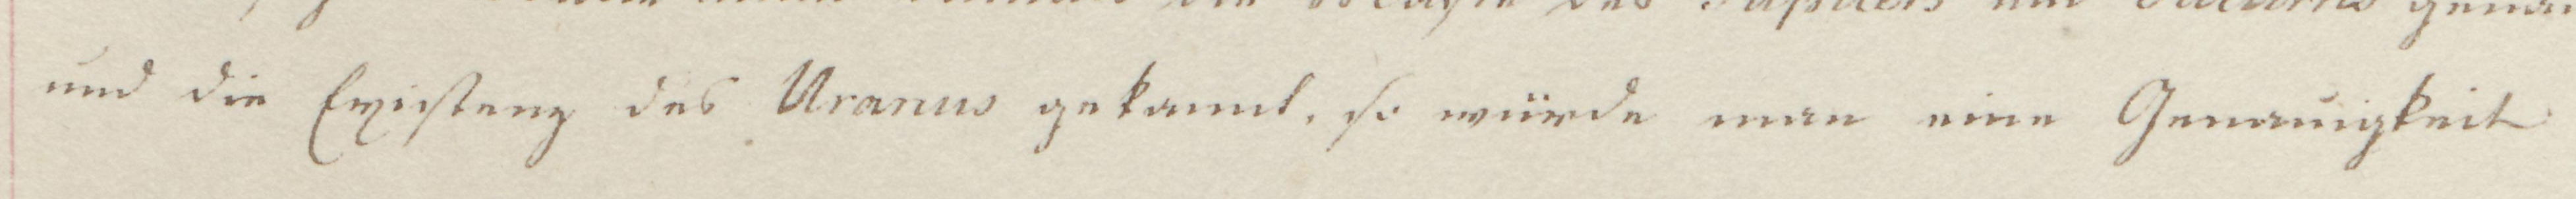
und die Existenz des Uranus gekannt, so würde man eine Genauigkeit
